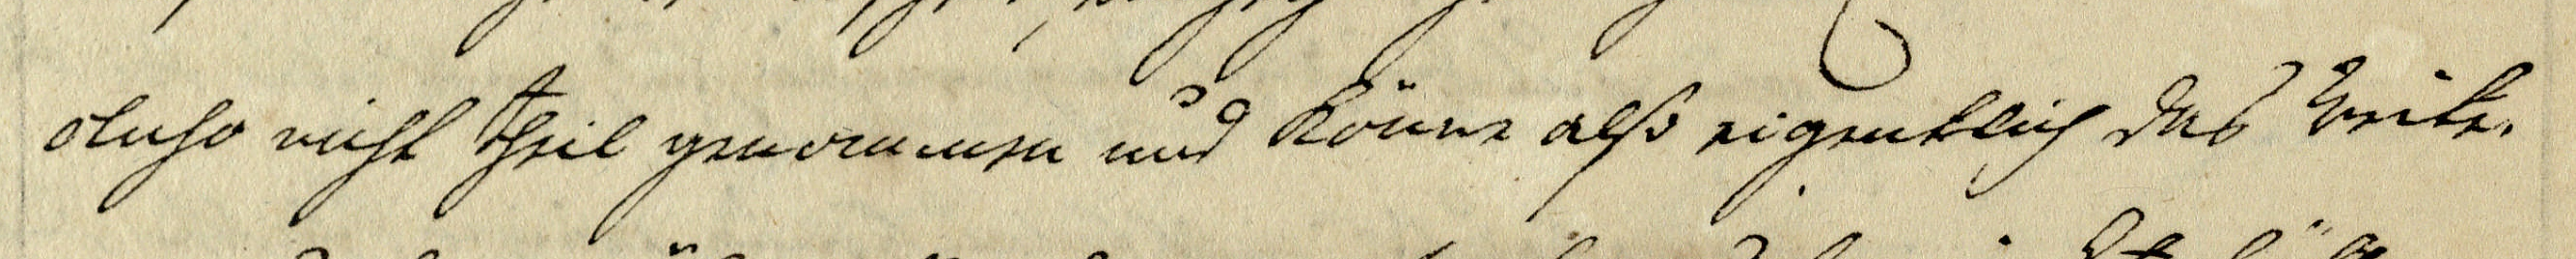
cluso nicht Theil genommen und könne als eigentlich das Weite¬
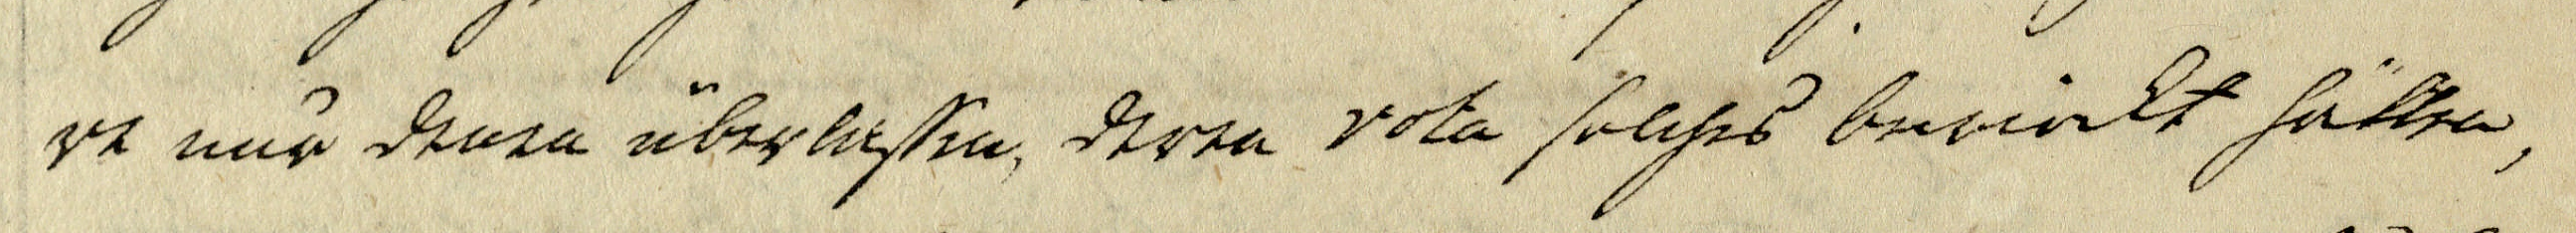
re nur denen überlassen, deren vota solches bewirckt hätten,
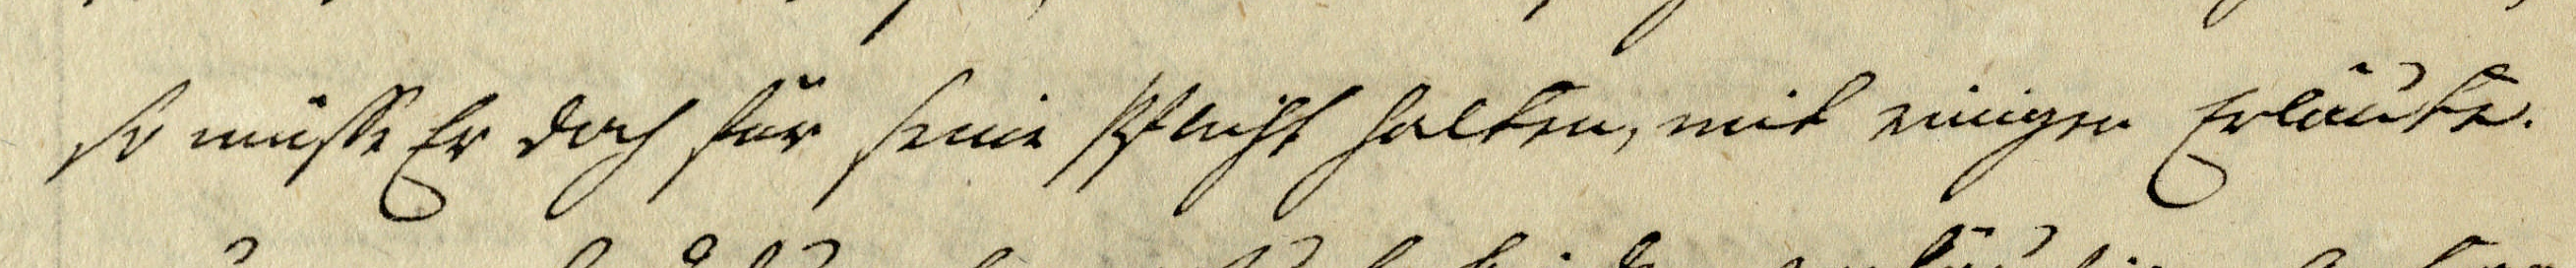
so müsse Er doch für seine Pflicht halten, mit einigen Erläute¬
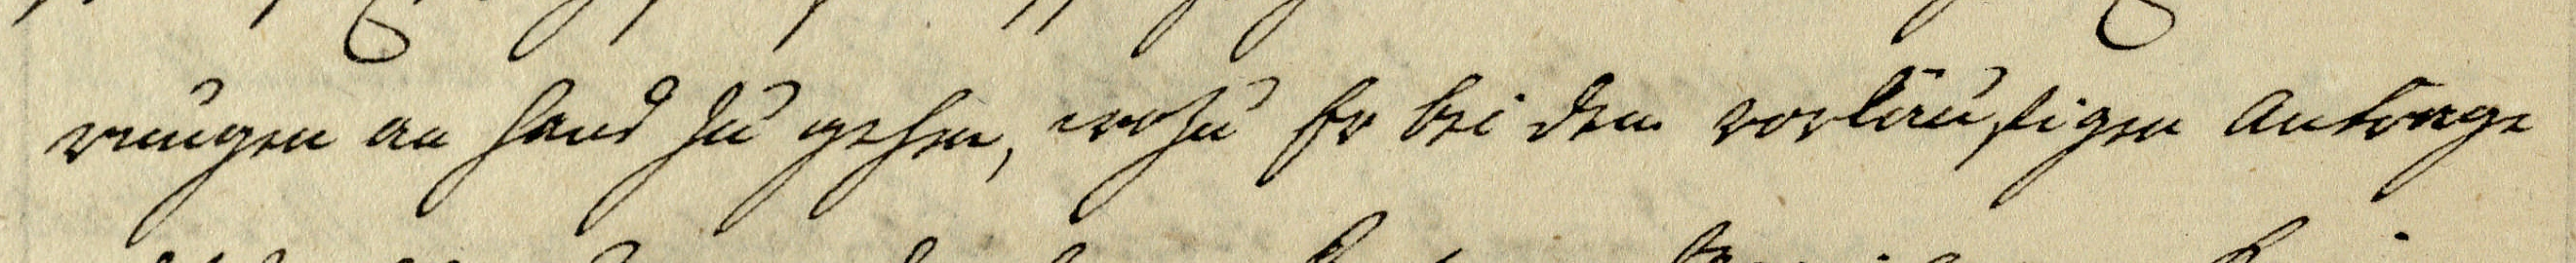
rungen an Hand zu gehen, wozu Er bei dem vorläufigen Antrage
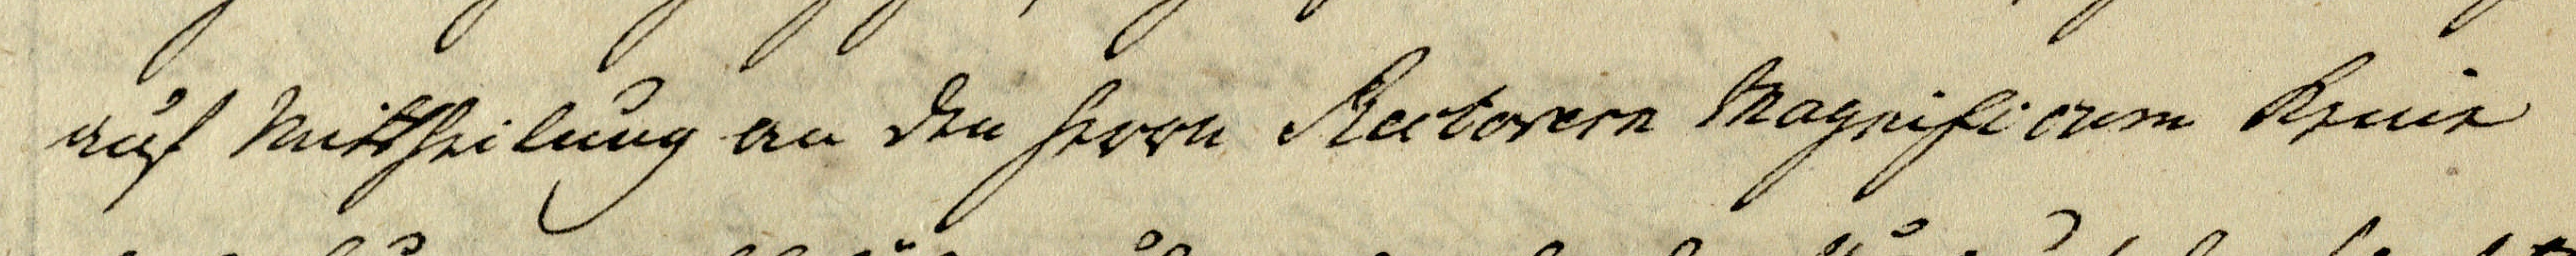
auf Mittheilung an den Herrn Rectorem Magnificum keine
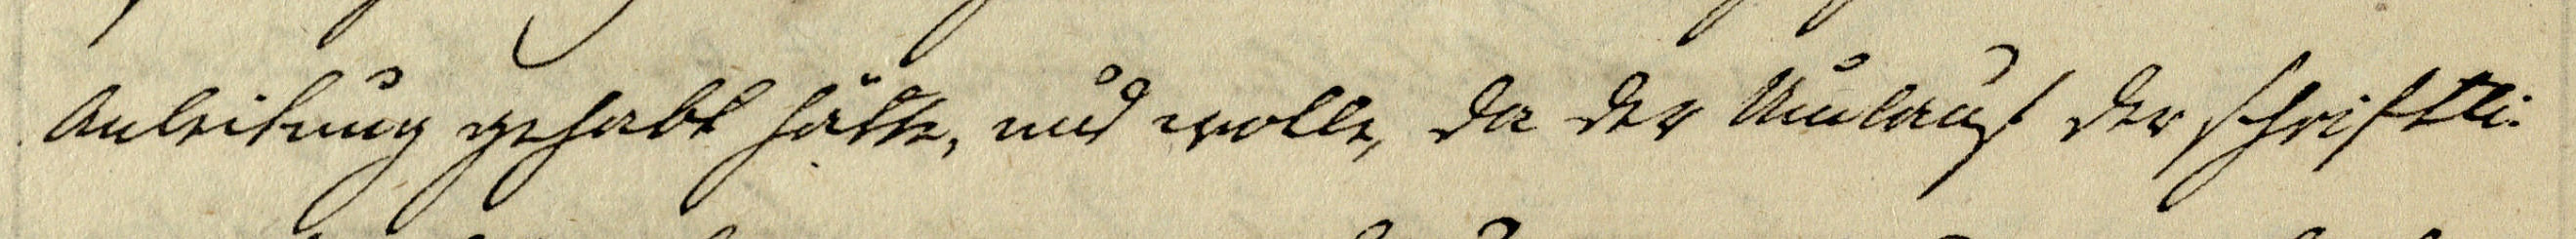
Anleitung gehabt hätte, und wolle, da der Umlauf der schriftli¬
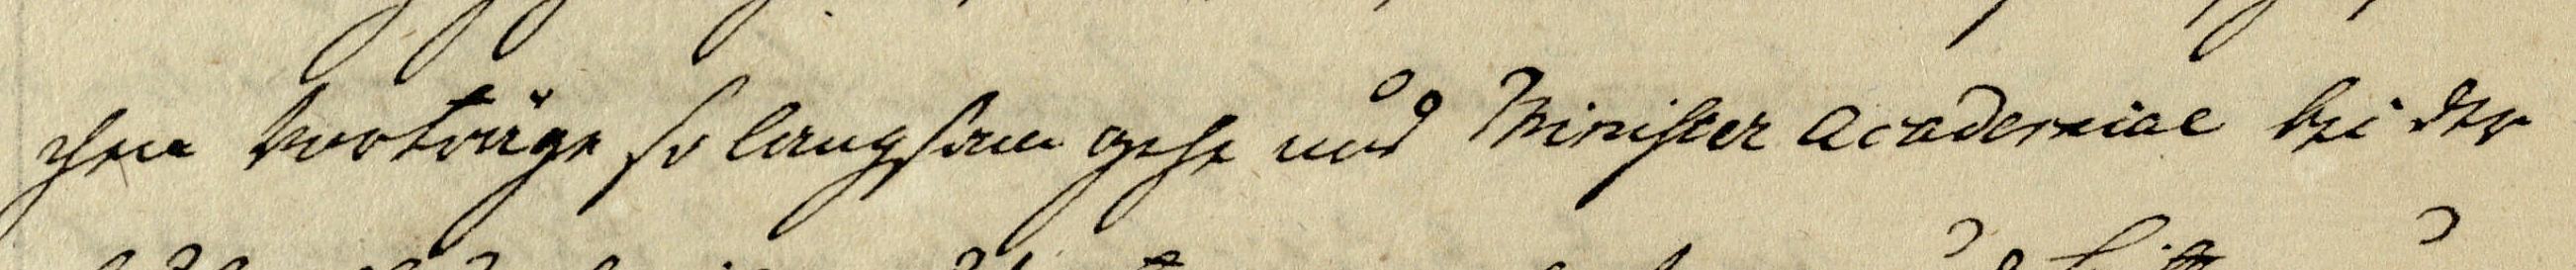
chen Vorträge so langsahm gehe und Minister Academiae bei der
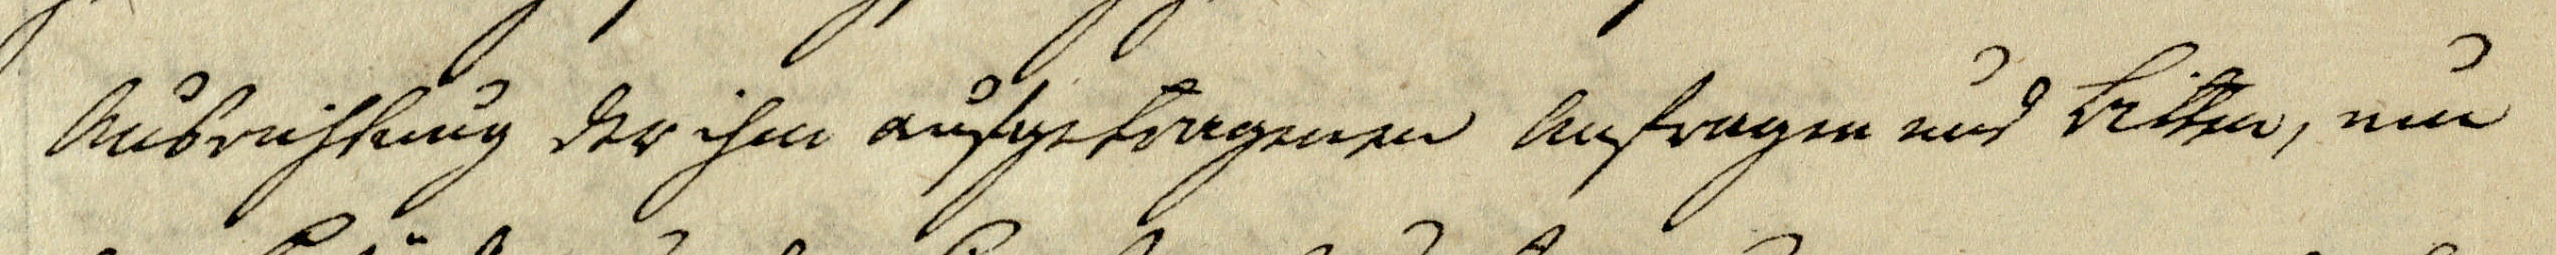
Ausrichtung der ihm aufgetragenen Anfragen und Bitten, um
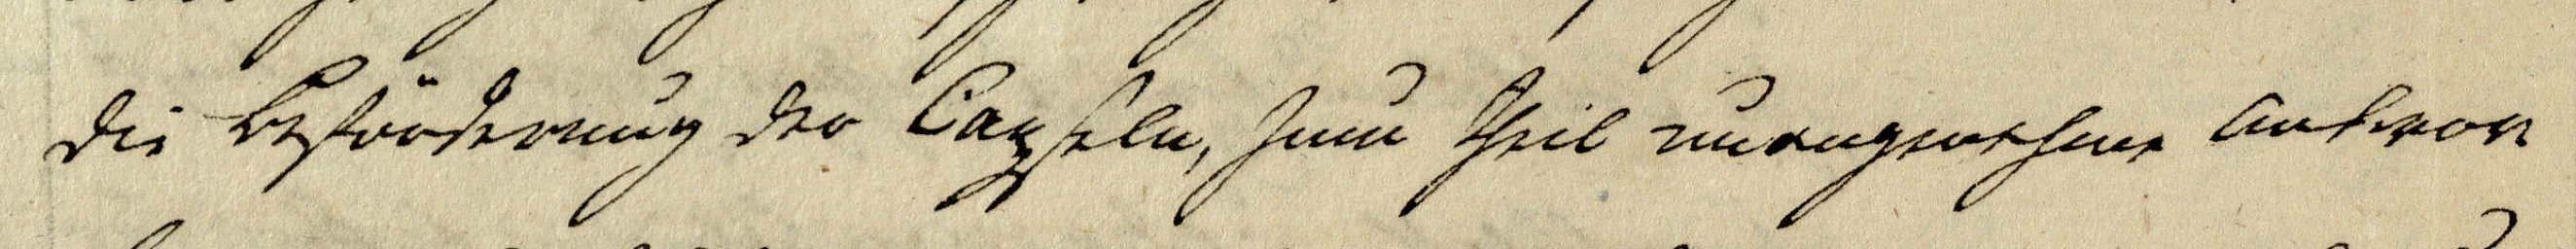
die Beförderung der Capseln, zum Theil unangenehme Antwor¬
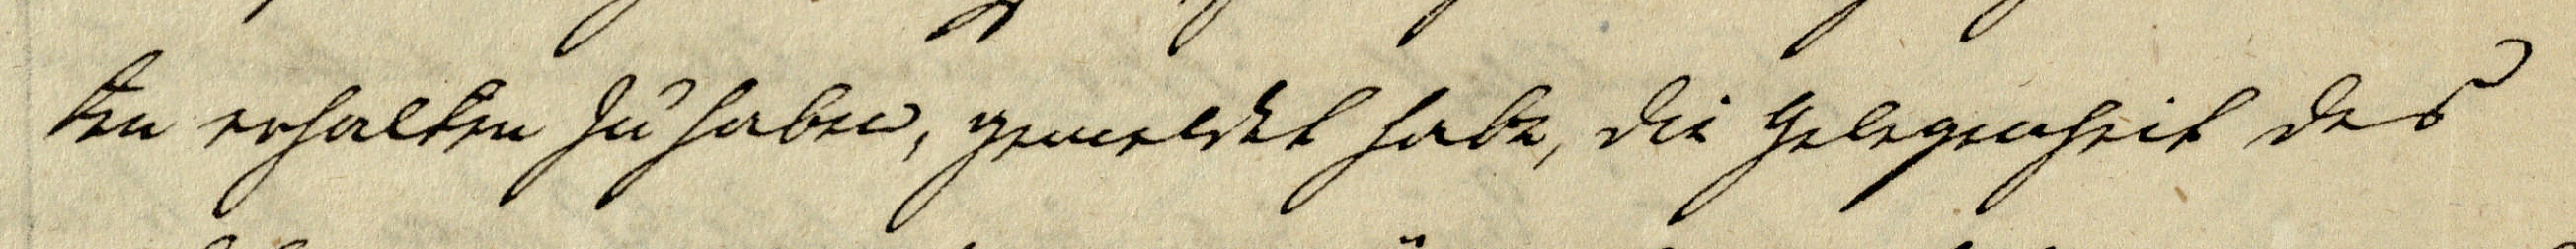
ten erhalten zu haben, gemeldet habe, die Gelegenheit des
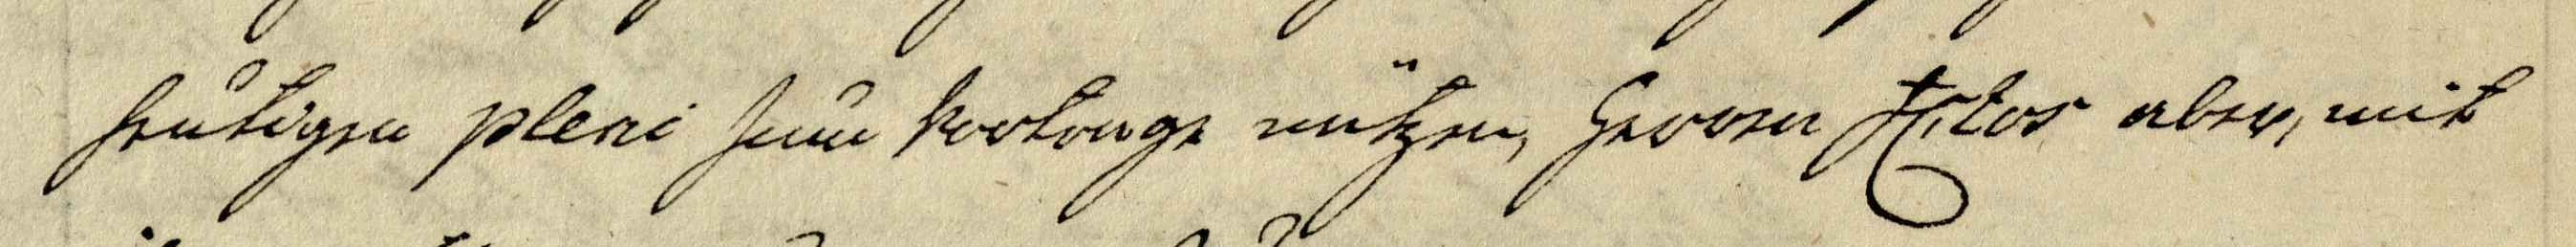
heutigen pleni zum Vortrage nützen, Herren Il.tos aber, mit
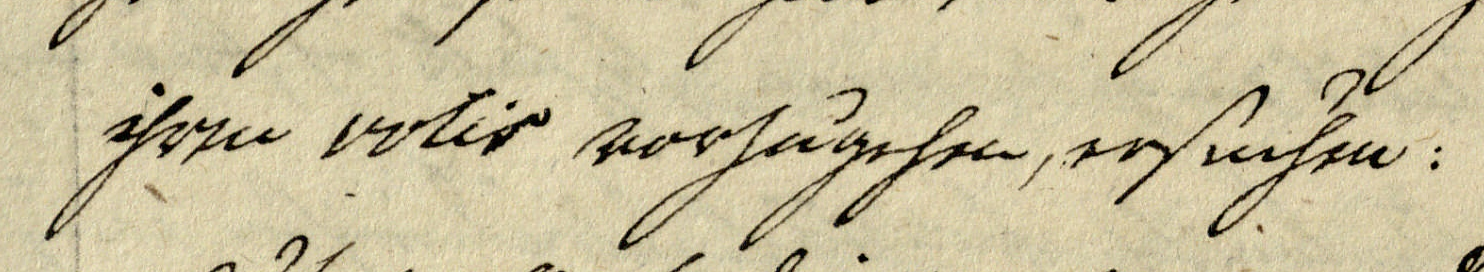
ihren votis vorzugehen, ersuchen:
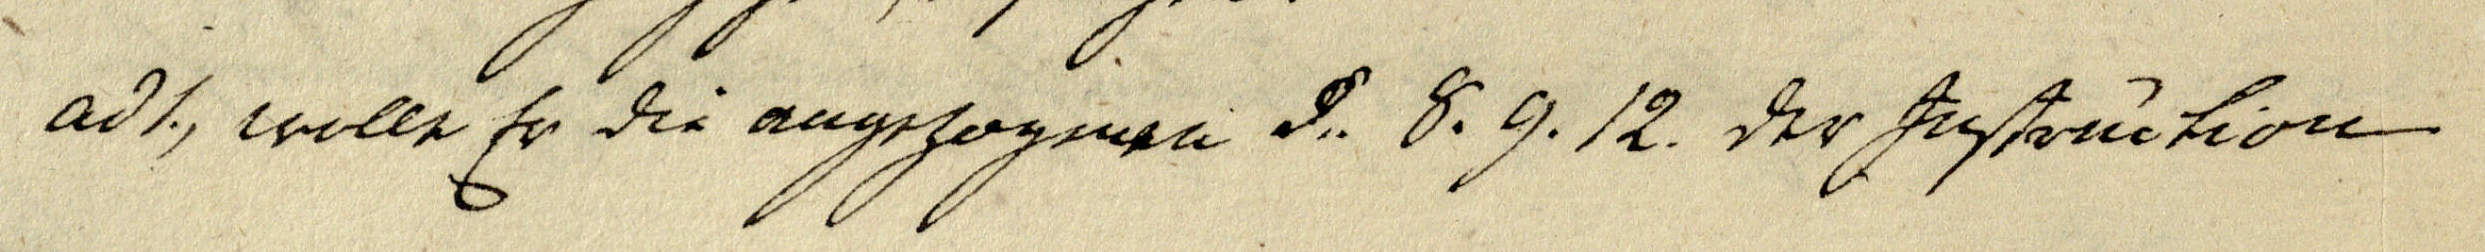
ad 1., wolle Er die angezogenen §. 8. 9. 12. der Instruction
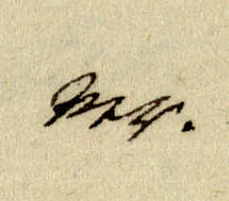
ver.
